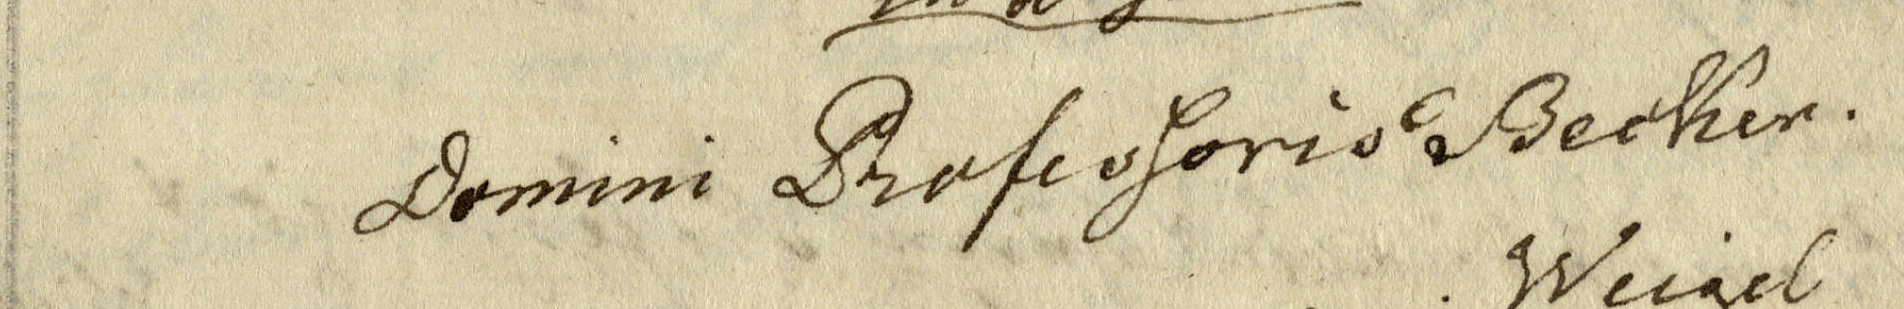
Domini Professoris Becker.
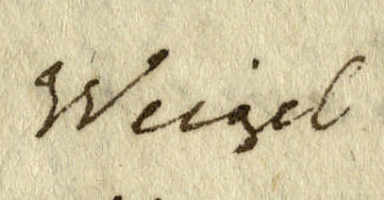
Weigel
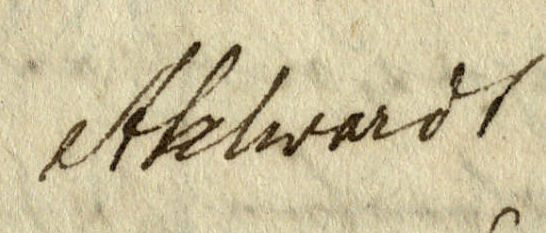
Ahlwardt
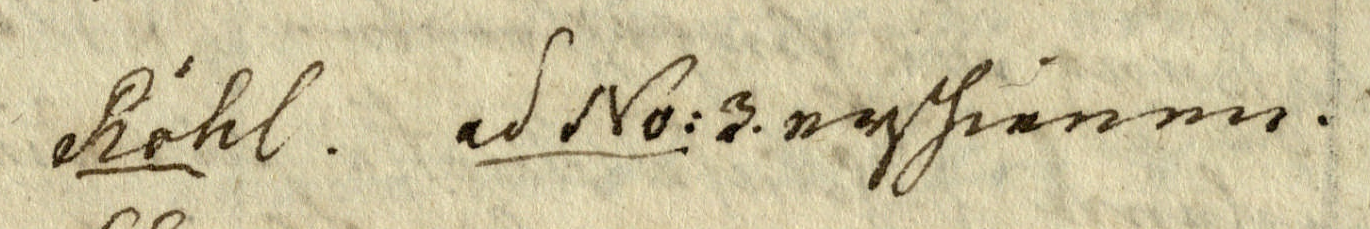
Röhl. ad No. 3 erschienen.
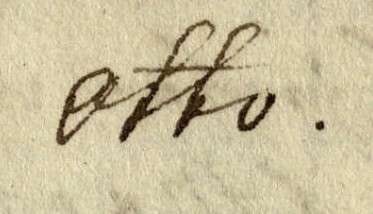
Otto.
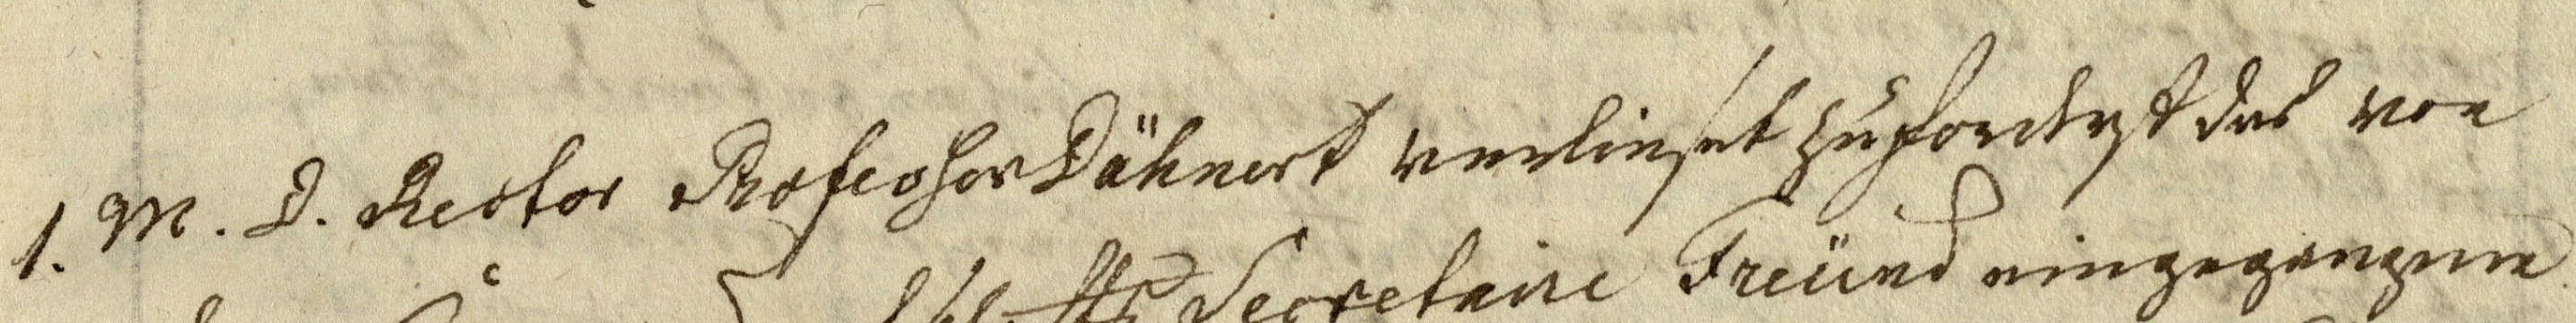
1. M. D. Rector Professor Dähnert verlieset zuforderst das von
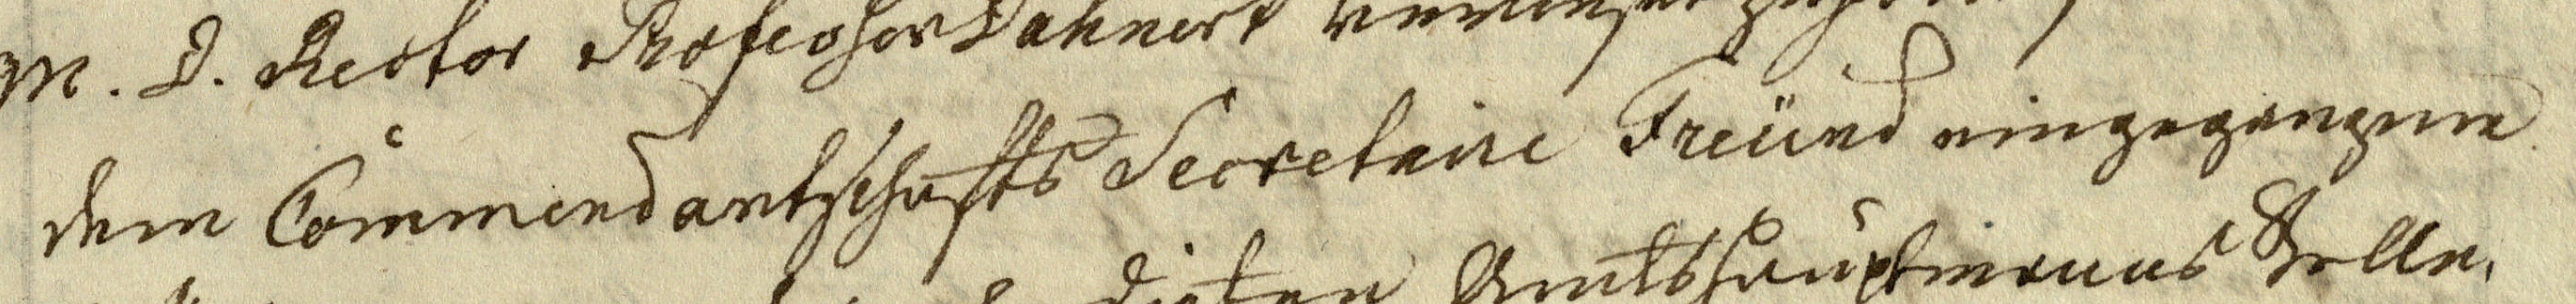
dem Commandantschafts Secretaire Freund eingegangene
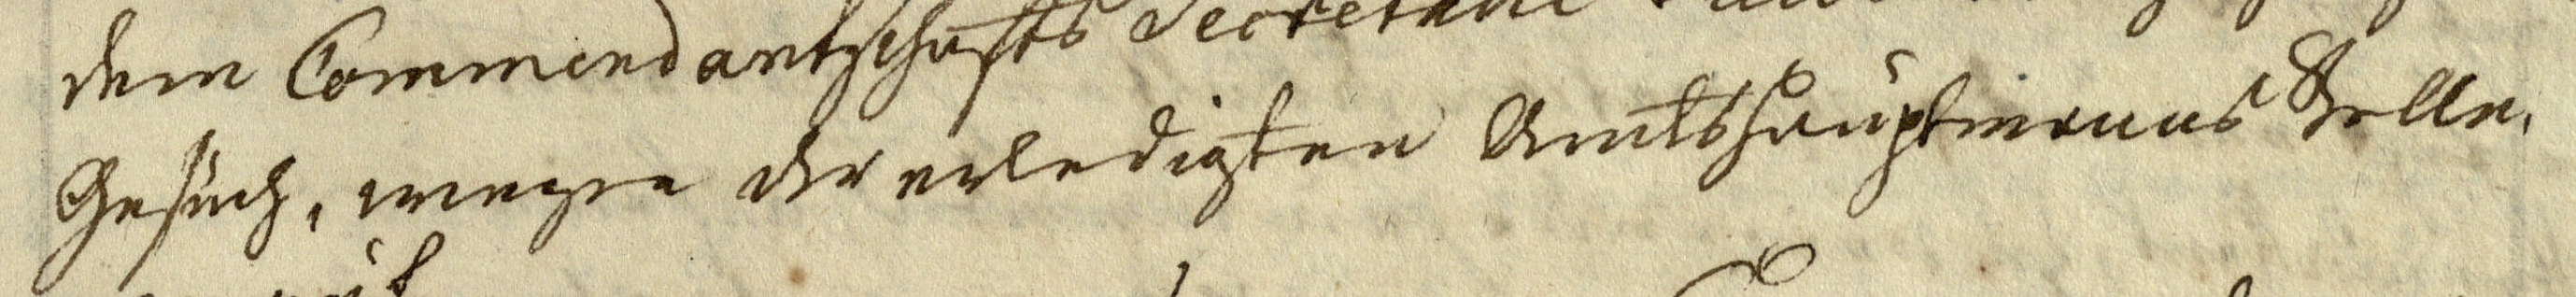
Gesuch, wegen der erledigten Amtshauptmanns Stelle
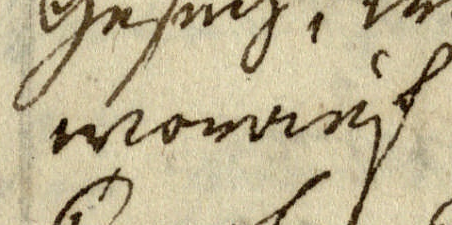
worauf
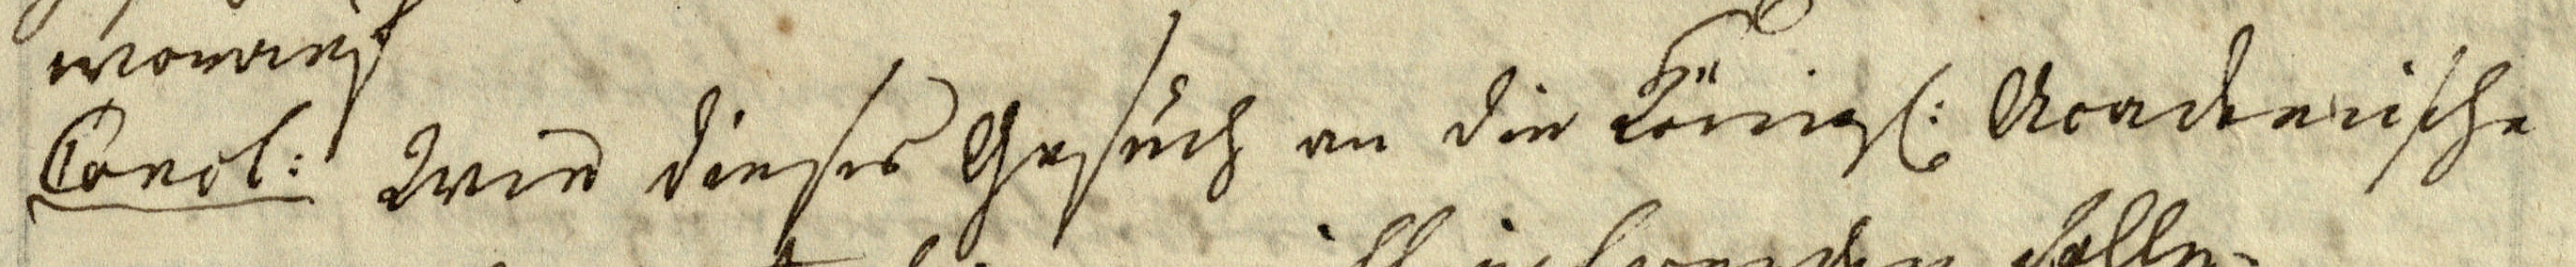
Concl. Wie dieses Gesuch an die Königl. Academische
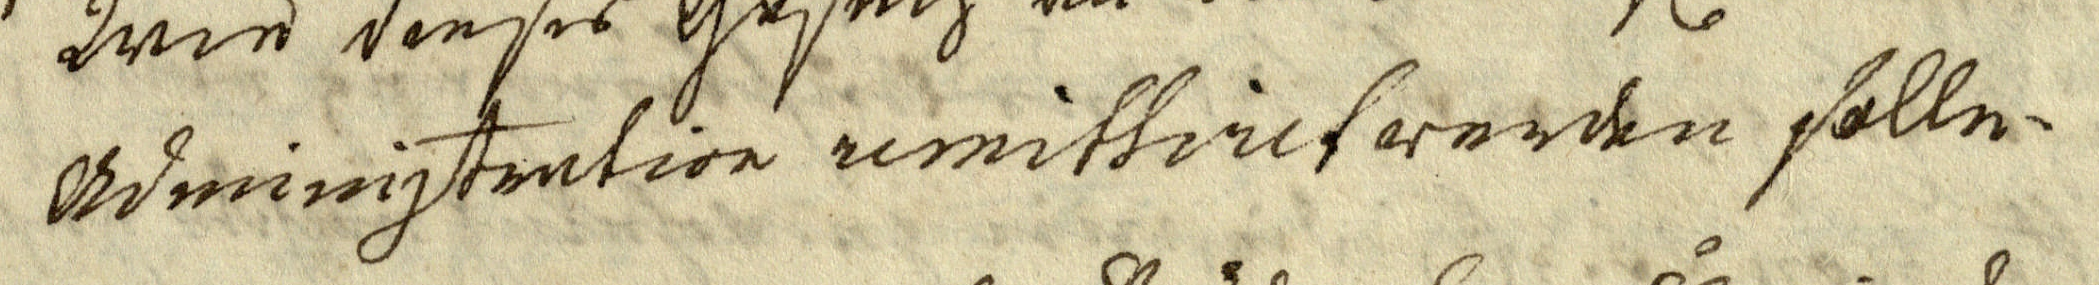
Administration remittiret werden solle.
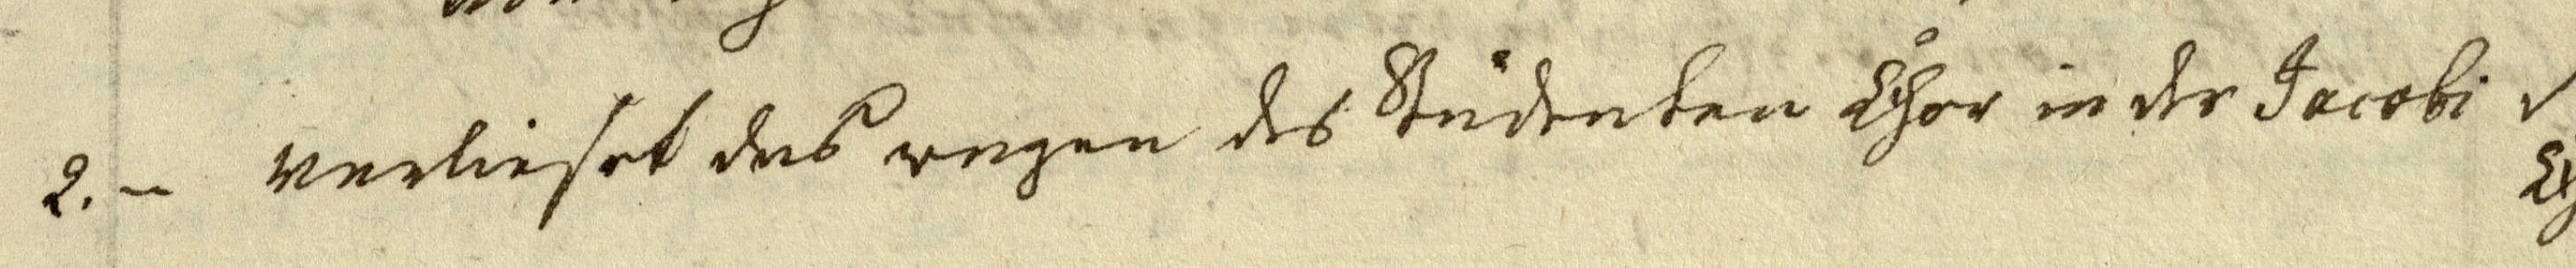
2. verlieset das wegen des Studenten Chor in der Jacobi
